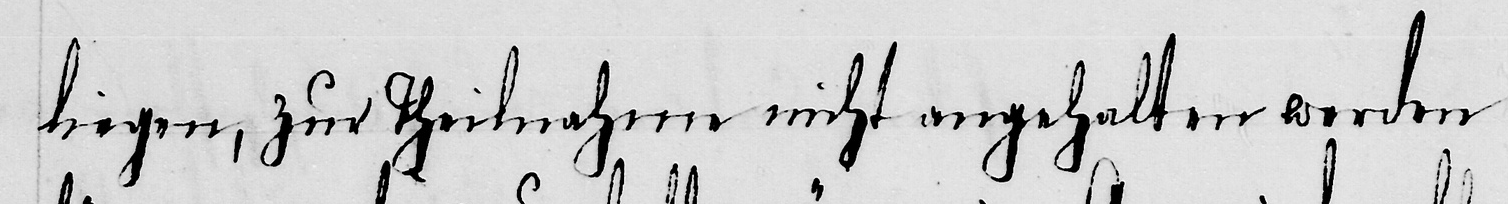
liegen, zur Theilung nicht angehalten werden
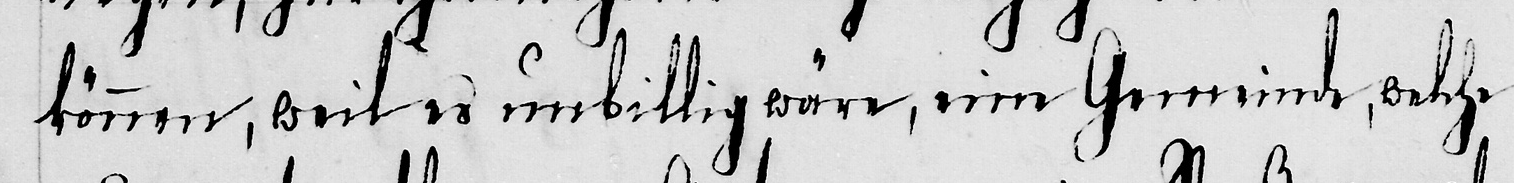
können, weil es unbillig wäre, eine Gemeinde, welche
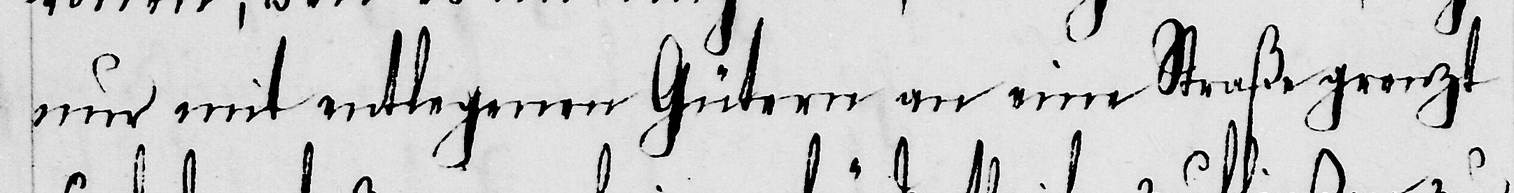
nur mit entlegenen Gütern an eine Straße grenzt
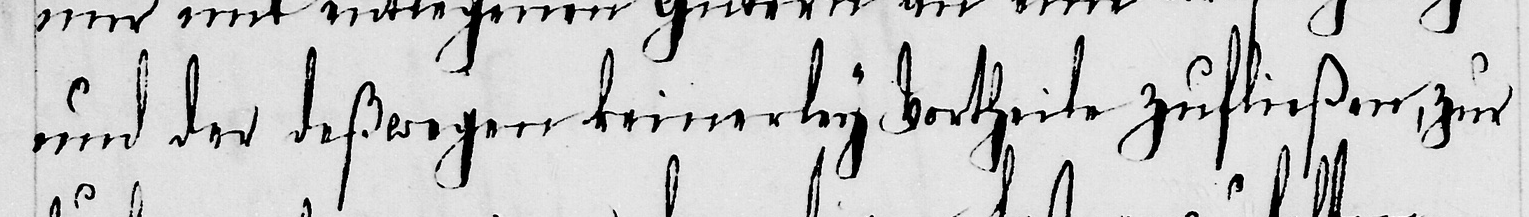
und der deßwegen keinerley Vortheile zufließen, zur
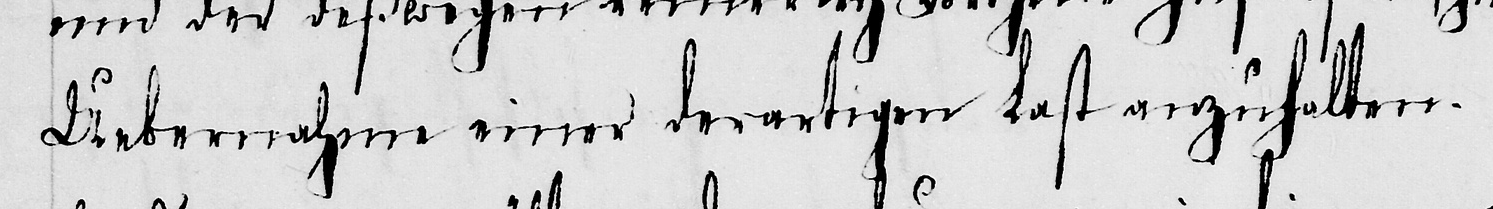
Uebernahme einer derartigen Last anzuhalten.
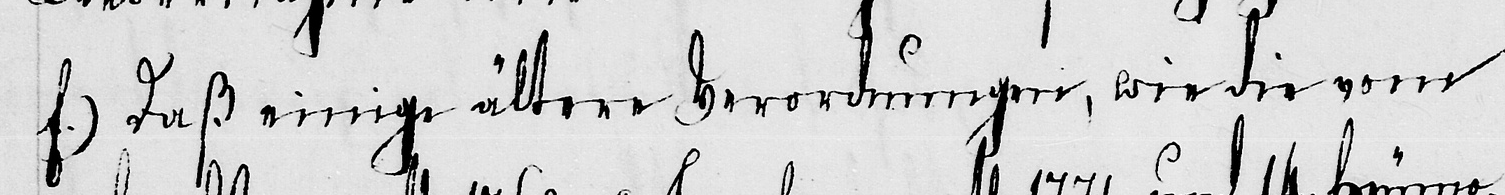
f.) Daß einige ältere Verordnungen, wie die vom
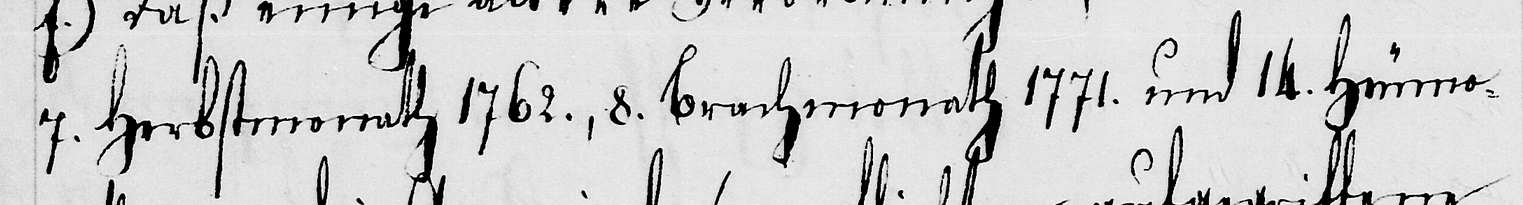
7. Herbstmonath 1762., 8. Brachmonath 1771. und 14. Heumo¬
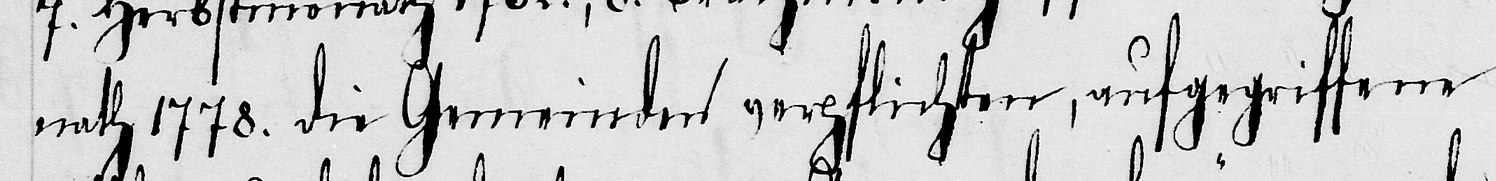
nath 1778. die Gemeinden verpflichten, aufgegriffene
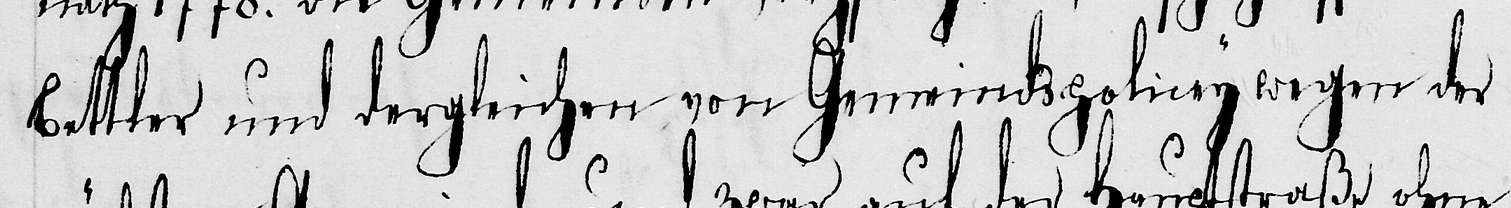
Bettler und dergleichen von Gemeindspolicey wegen der
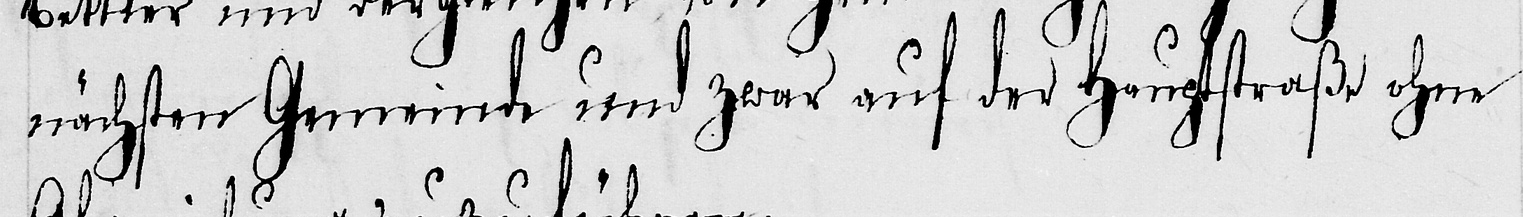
nächsten Gemeinde und zwar auf der Hauptstraße ohne
